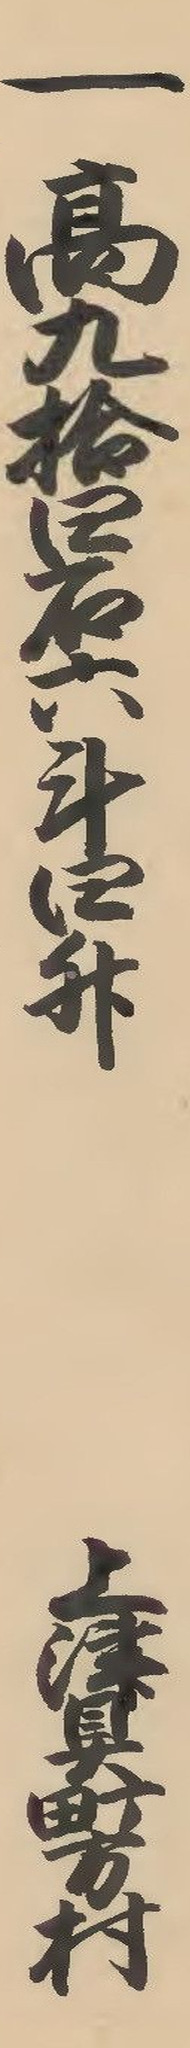一高九拾四石六斗四升上津具町方村

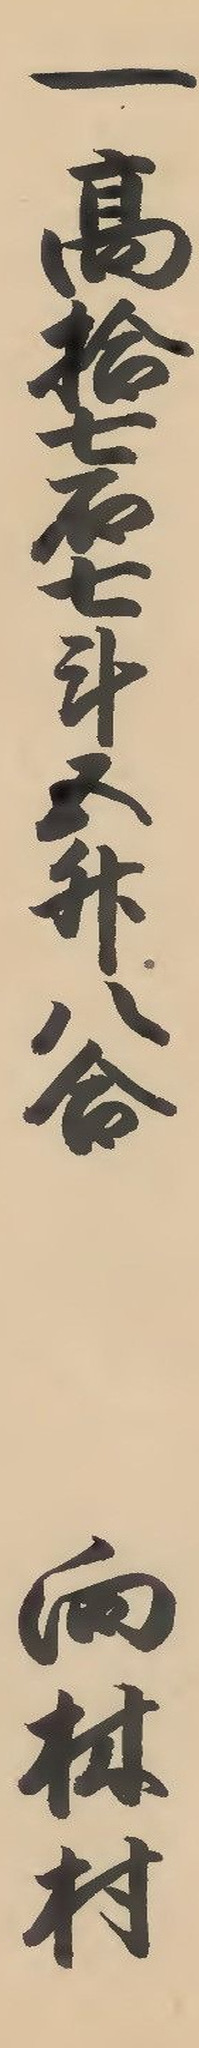一高拾七石七斗五升八合向林村
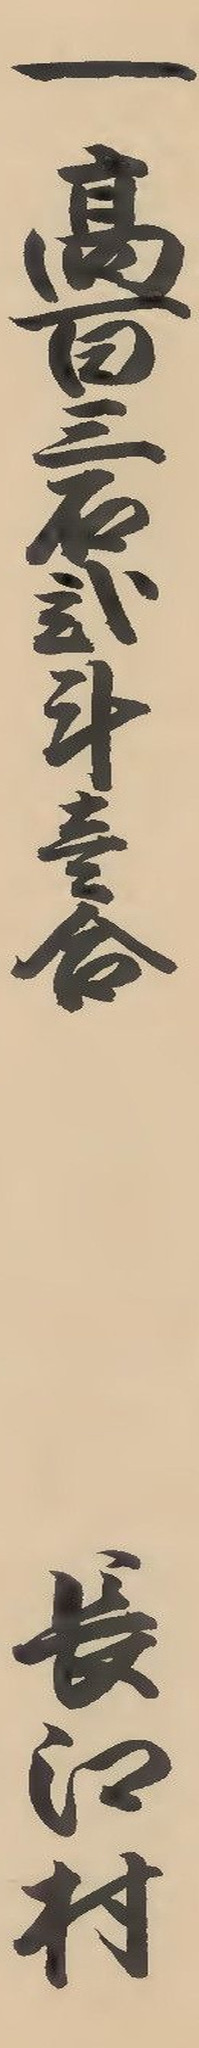一高百三石弐斗壱合長江村
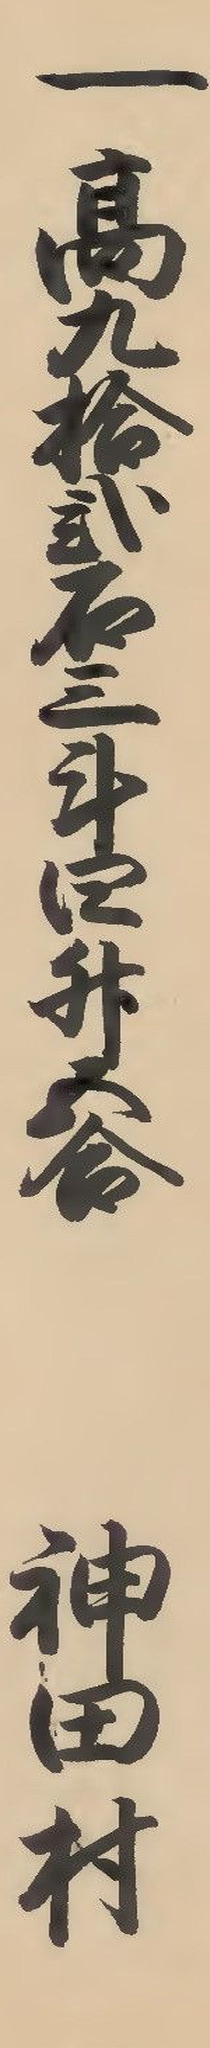一高九拾弐石三斗四升五合神田村
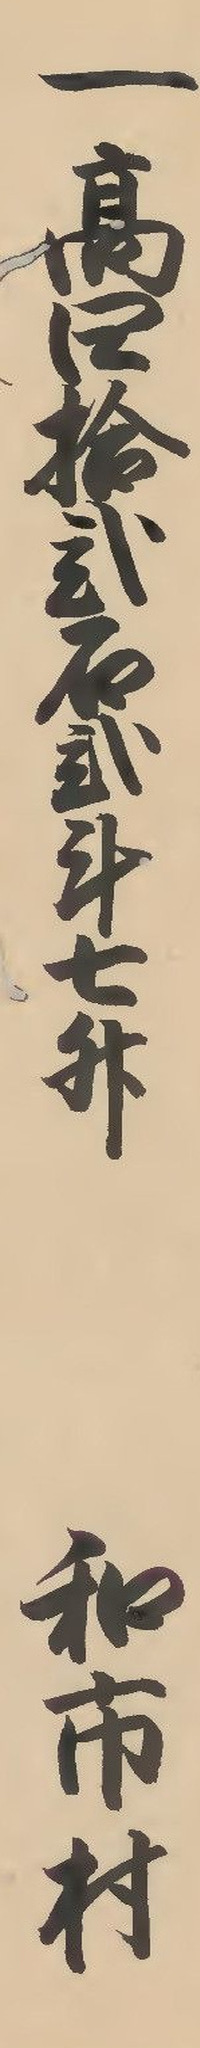一高四拾弐石弐斗七升和市村
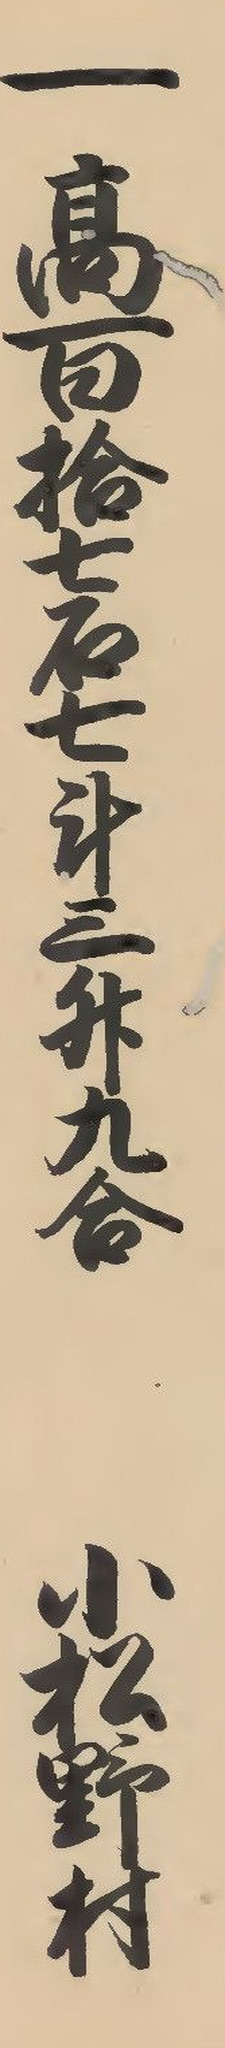一高百拾七石七斗三升九合小松野村
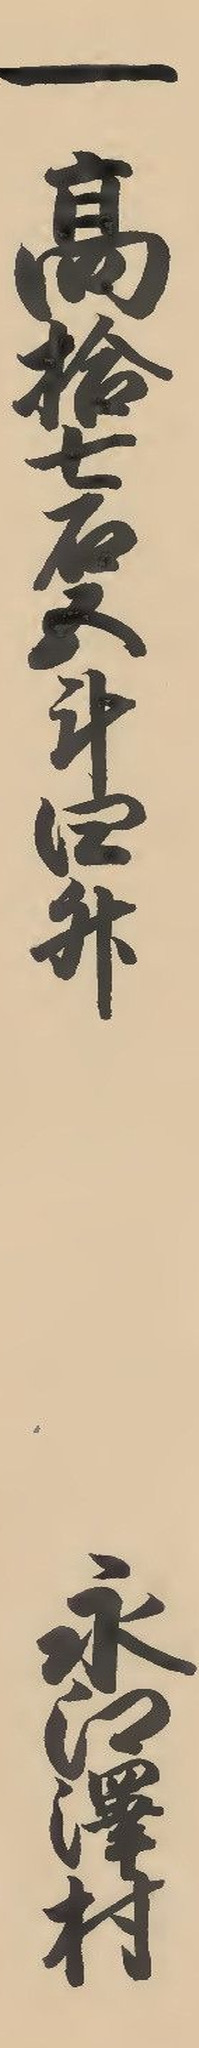一高拾七石五斗四升永江沢村
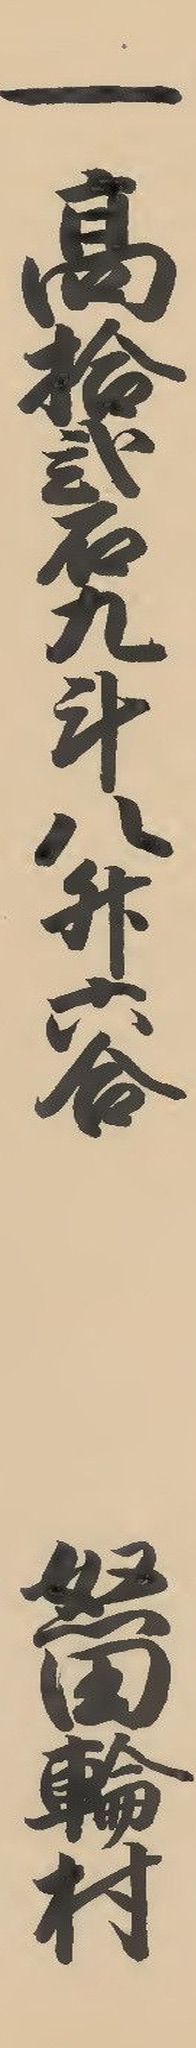一高拾弐石九斗八升六合怒田輪村
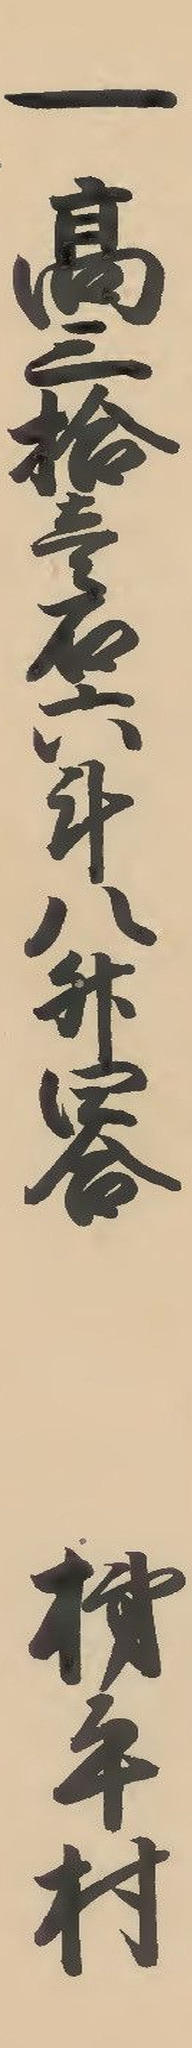一高三拾壱石六斗八升四合柿平村

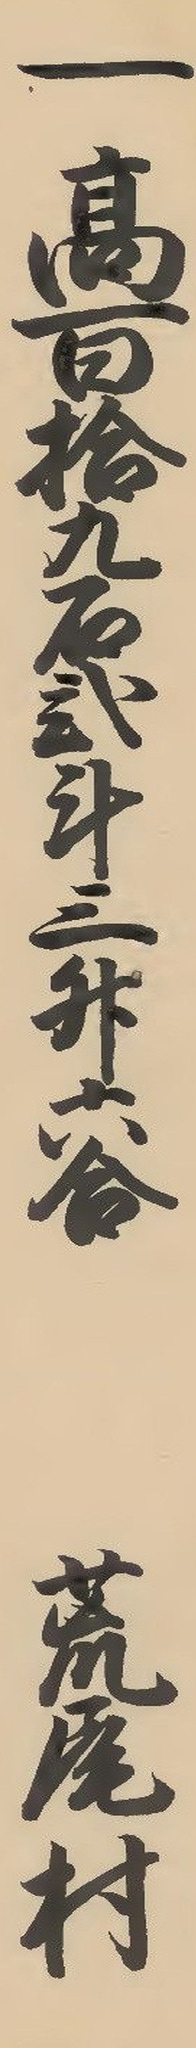一高百拾九石弐斗三升六合荒尾村
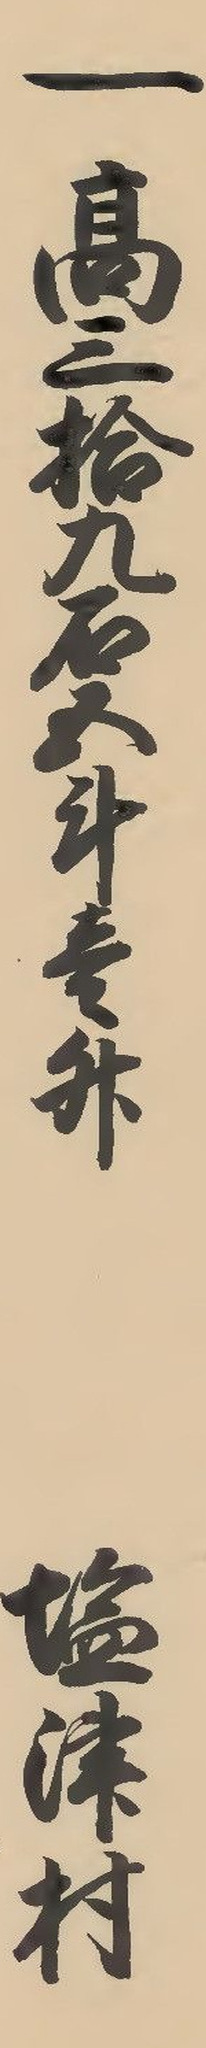一高三拾九石五斗壱升塩津村
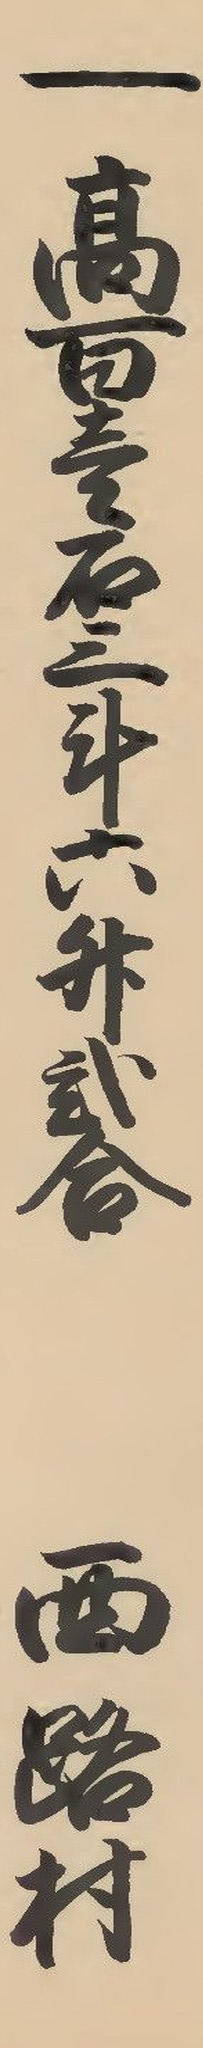一高百壱石三斗六升弐合西路村
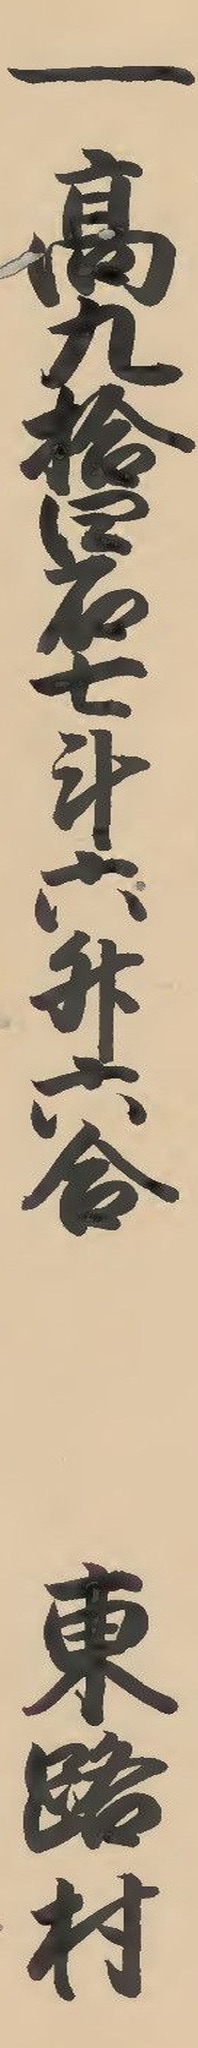一高九拾四石七斗六升六合東路村
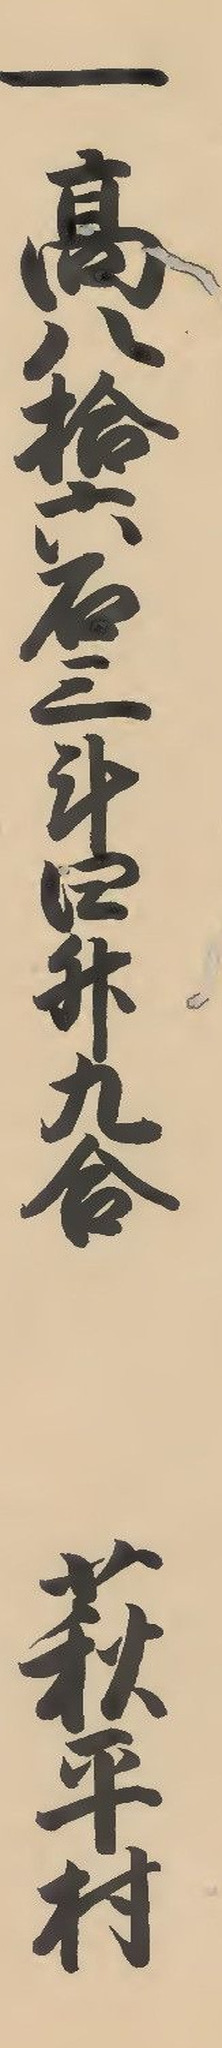一高八拾六石三斗四升九合萩平村
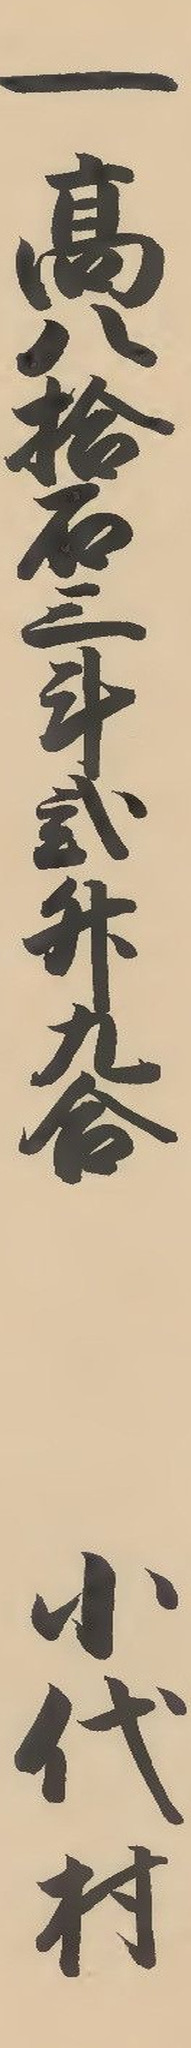一高八拾石三斗弐升九合小代村
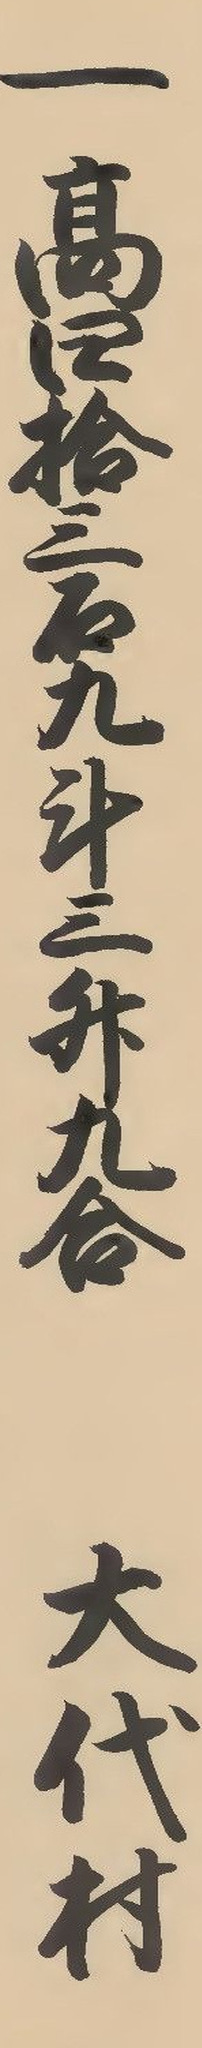一高四拾三石九斗三升九合大代村
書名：三河国郷帳
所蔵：国立公文書館 National Archives of Japan
